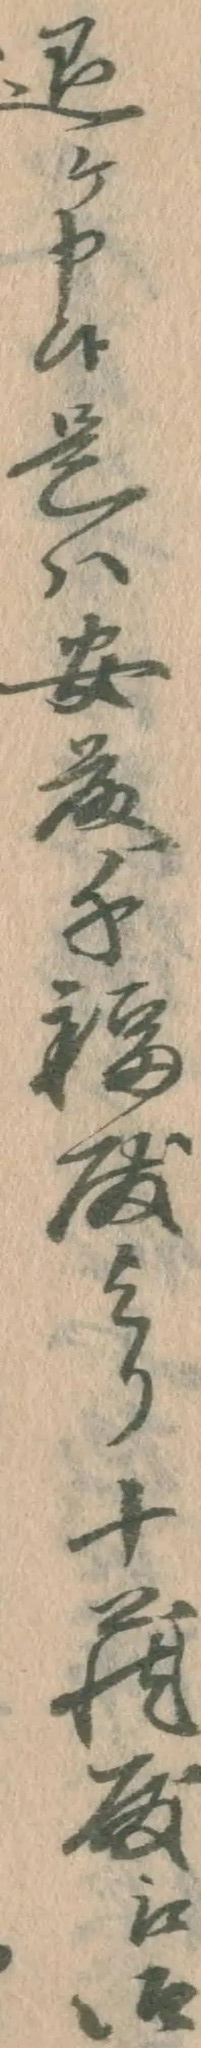退け申候是は安藤千福殿与り十蔵殿江御
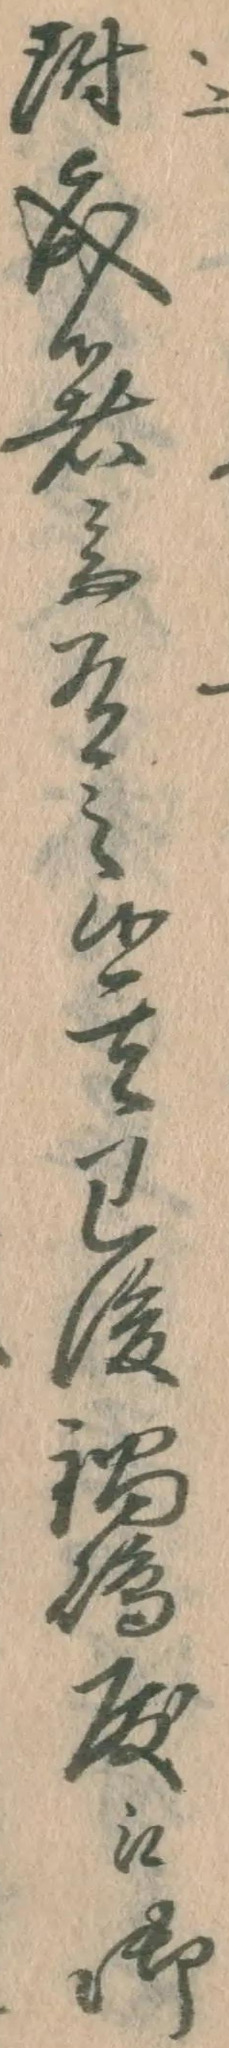附被成候者に而有之候其已後鍋島殿江御
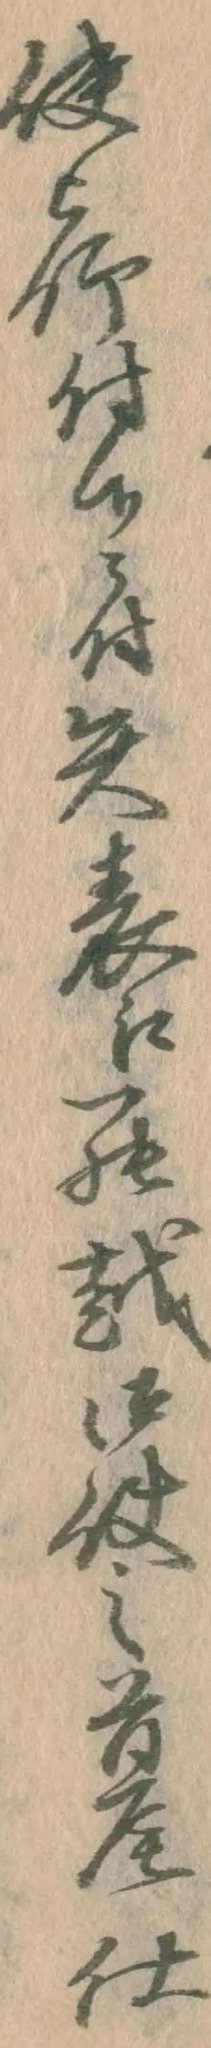使被仰付候に付矢表江罷越御使之首尾仕
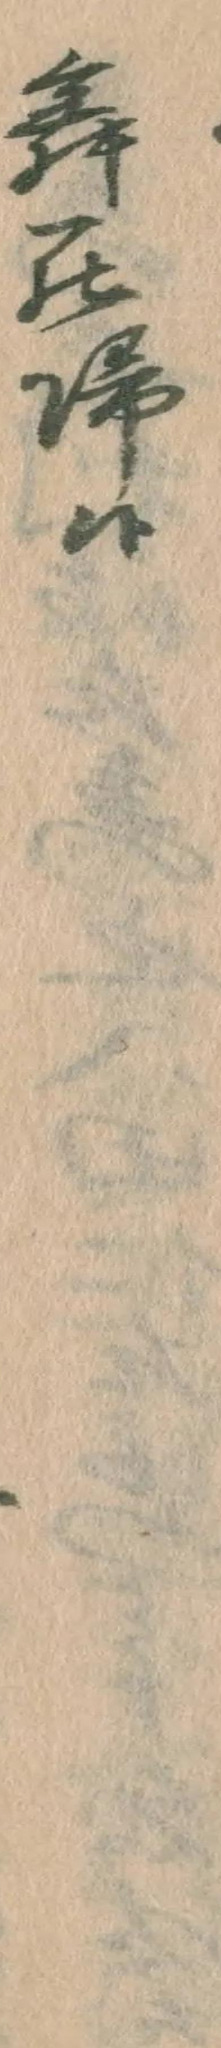舞罷帰候
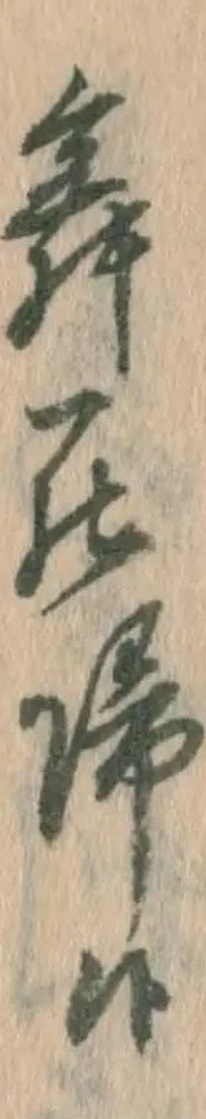舞罷帰候
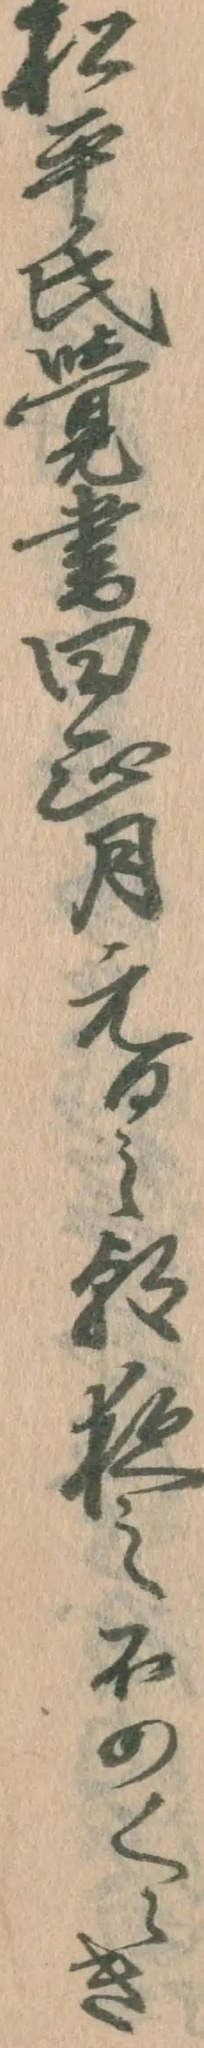松平氏覚書曰正月元日之朝夜之不のくらき
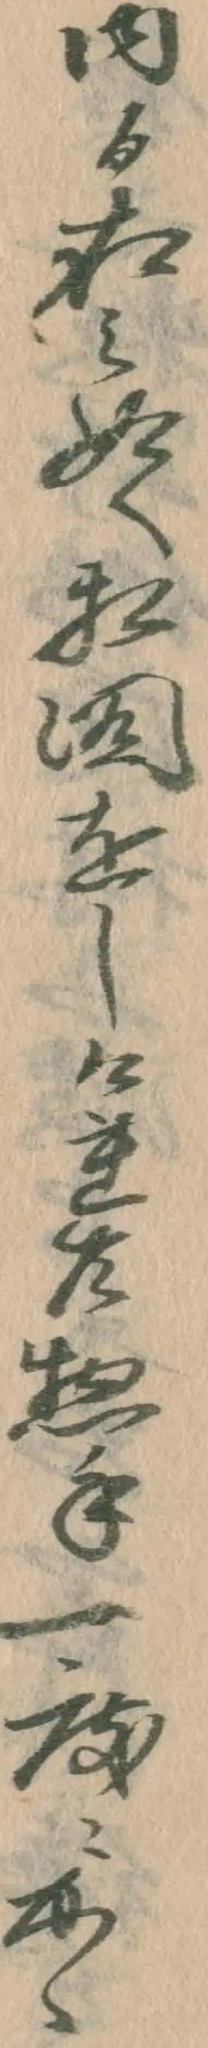内ゟ右之如く相図をしけ連共惣手一度にかゝ
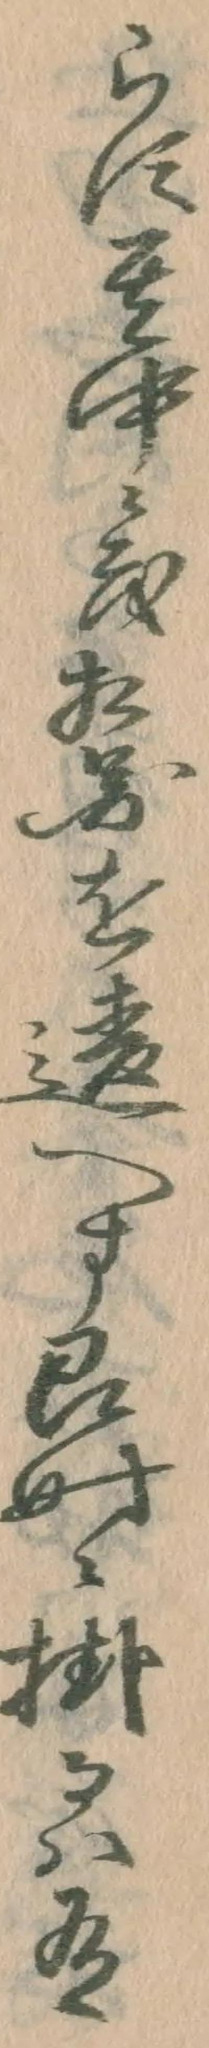ら須其中に茂相図を違へす即時に掛るは有
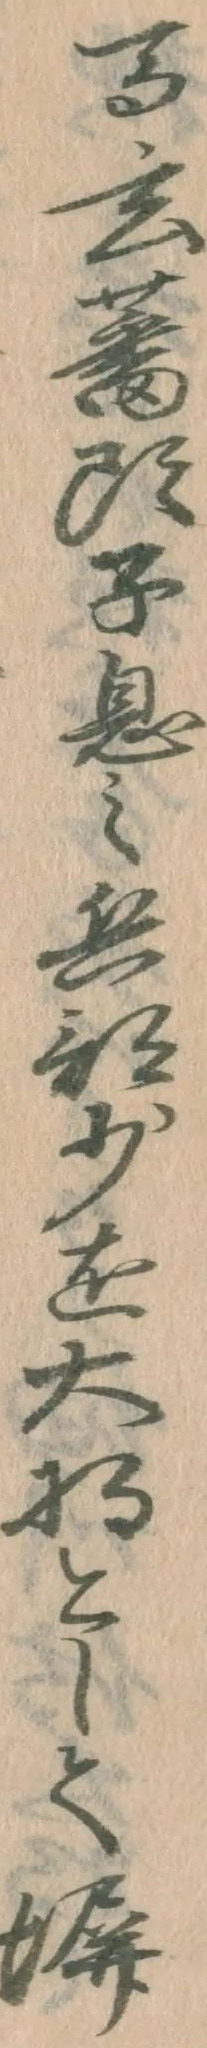馬玄蕃頭子息之兵部少を大将として塀
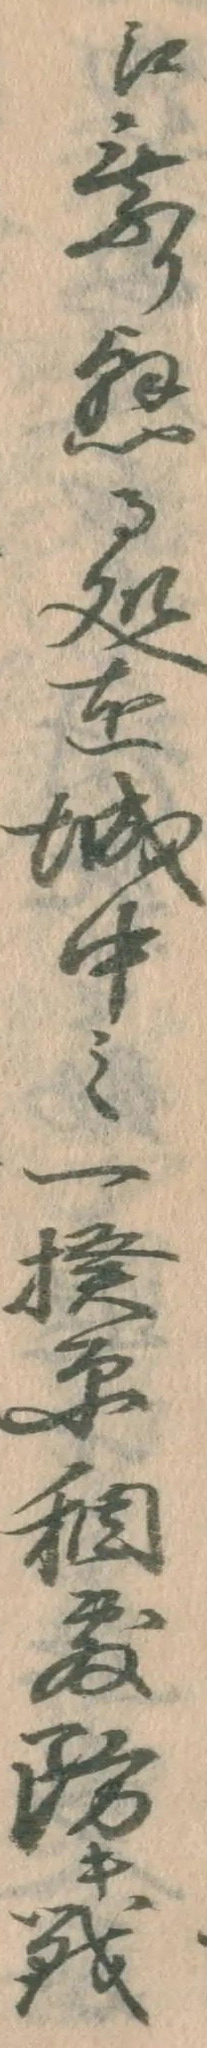江乗り懸る処を城中之一揆原稠敷防き戦
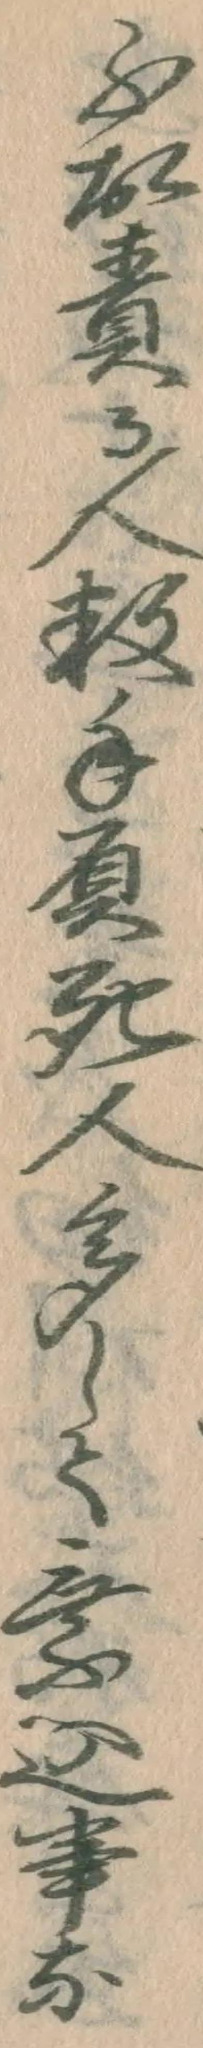ふ故責る人数手負死人多して乗込事な
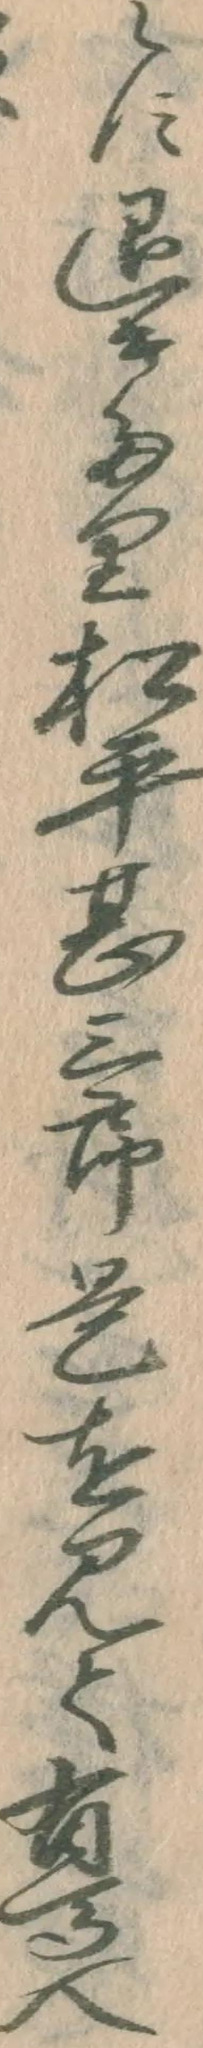ら須退き多里松平甚三郎是を見て有馬人
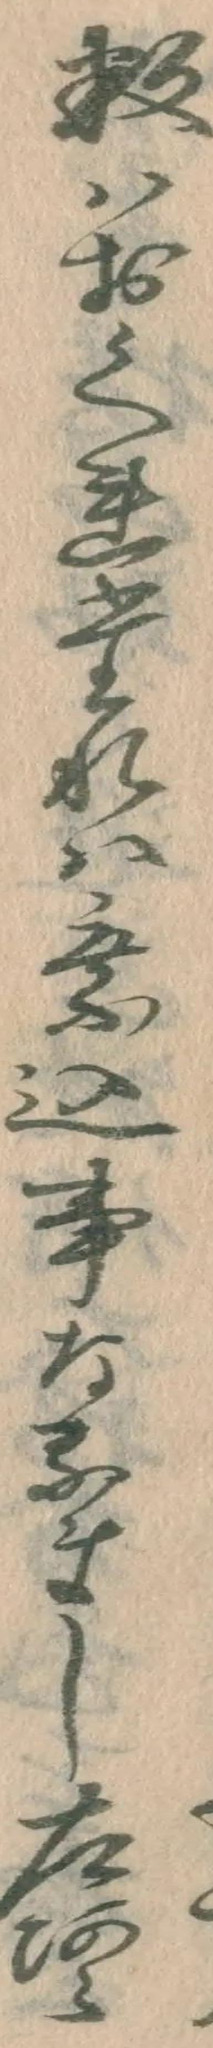数はおく連堂れは乗込事なるまし左阿ら
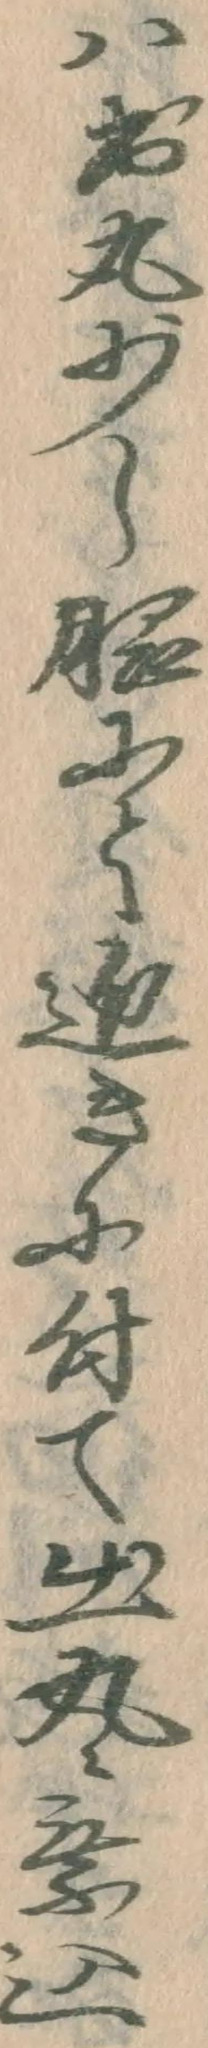は出丸少し脇尓て近き尓付て出丸に乗込
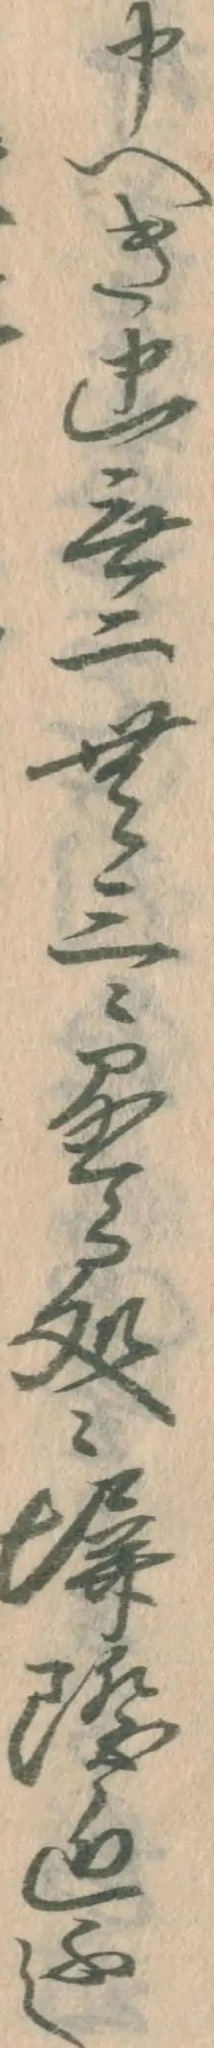申へき迚無二無三に懸る処に塀際近ふし
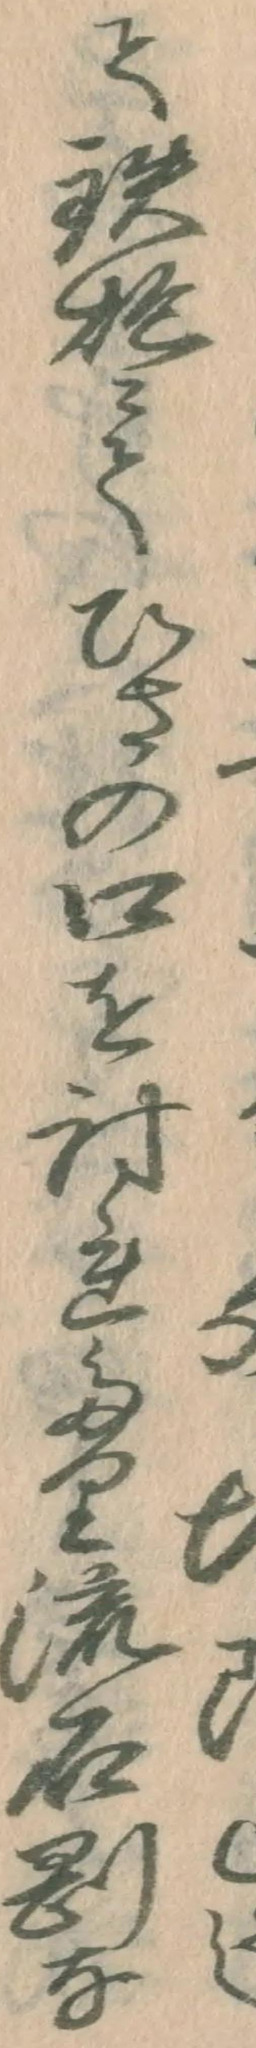て鉄炮にてひさの口を討連多里流石別な
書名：切支丹御退治記 49巻. [5]
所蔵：国立国会図書館 National Diet Library, JAPAN
